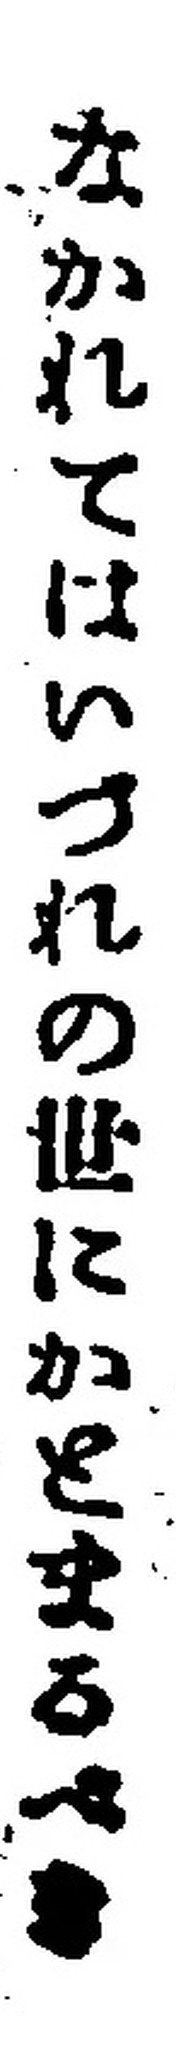なかれてはいづれの世にかとまるべき
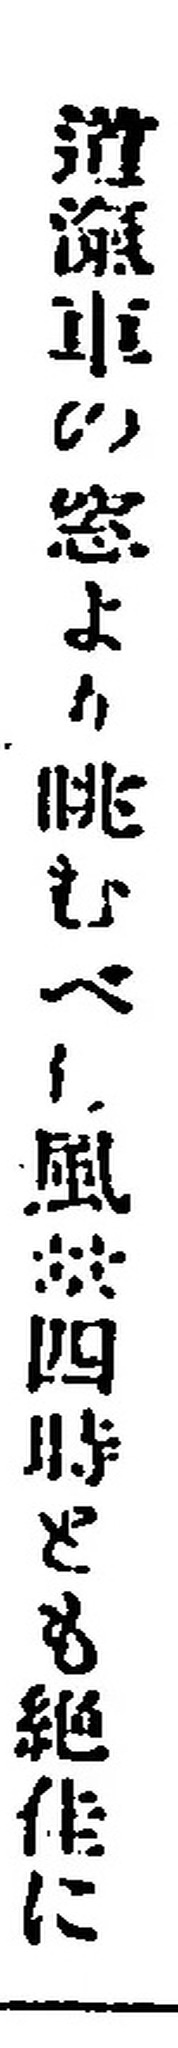道汽車の窓より眺むべし風景四時とも絶佳に
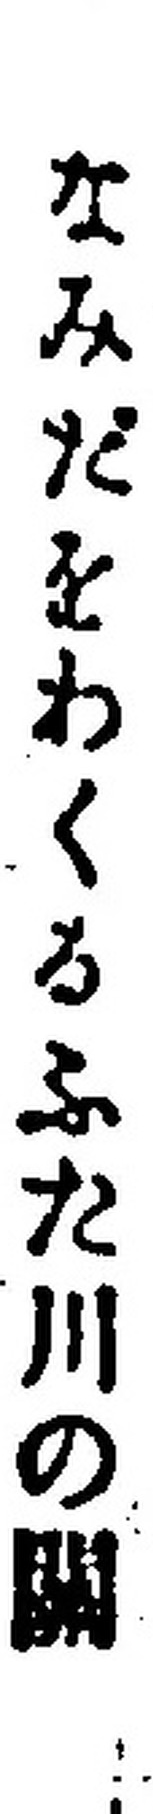なみだをわくるふた川の関
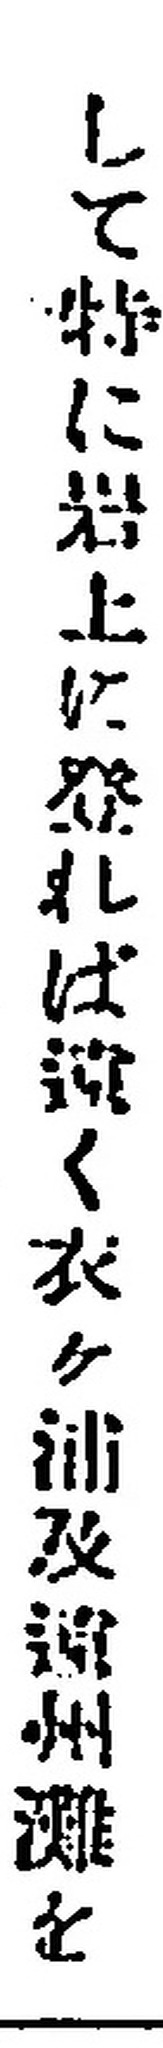して特に岩上に登れば遠く衣ヶ浦及遠州灘を
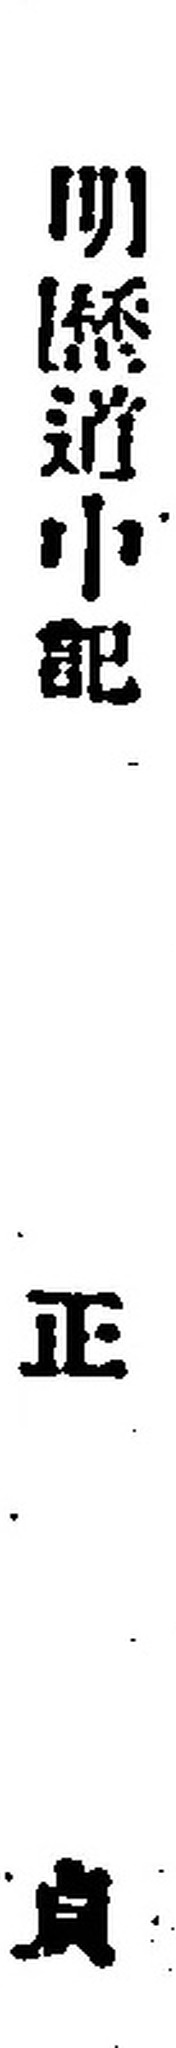明歴道中記正貞
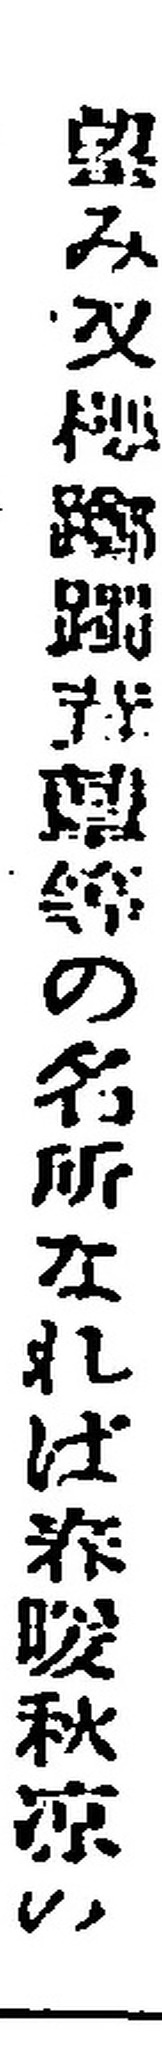望み又桜躑躅茸等の名所なれば春暖秋涼の
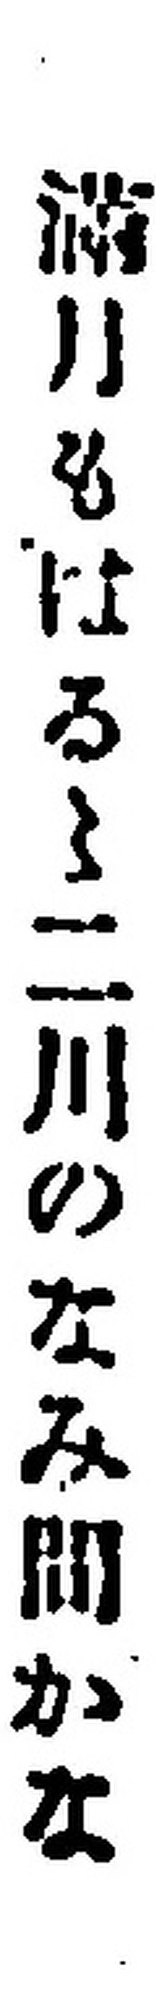満月もはるゝ二川のなみ間かな
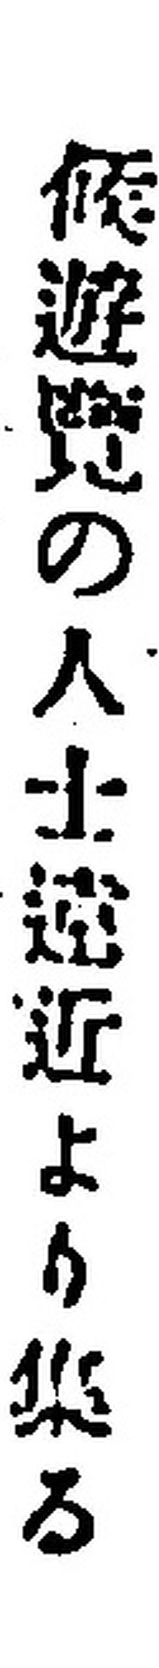候遊覧の人士遠近より集る
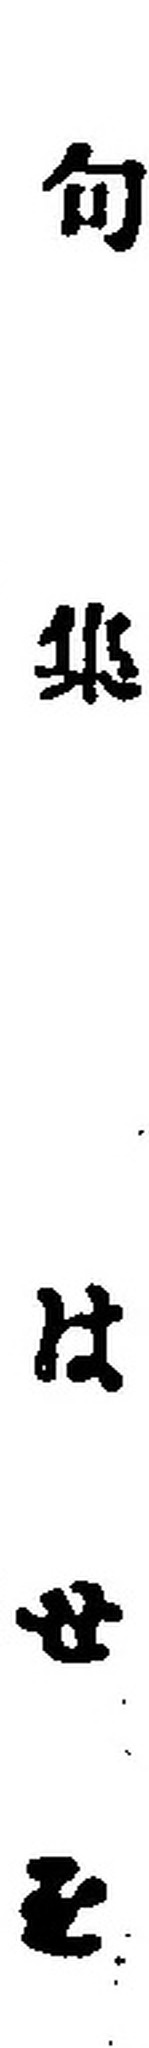句集はせを
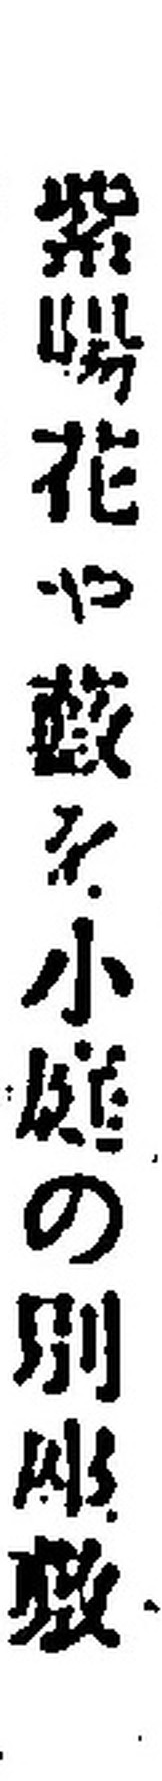紫陽花や藪を小庭の別座敷
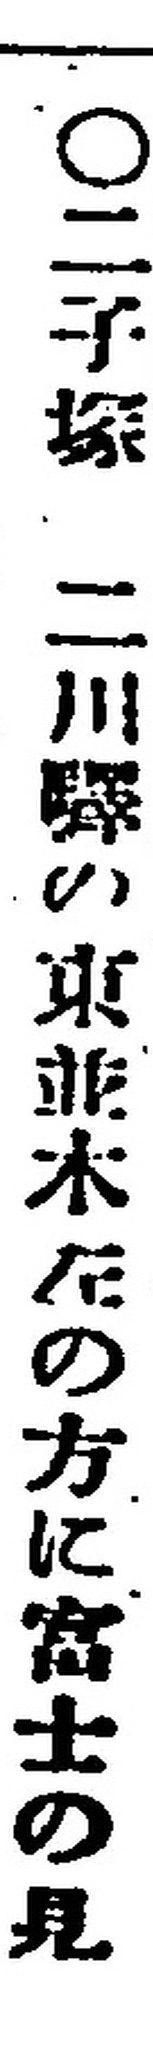○二子塚二川駅の東並木左の方に富士の見
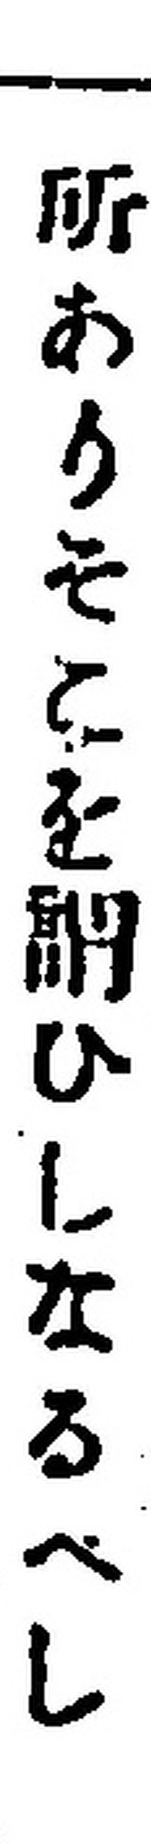所ありそこを謂ひしなるべし
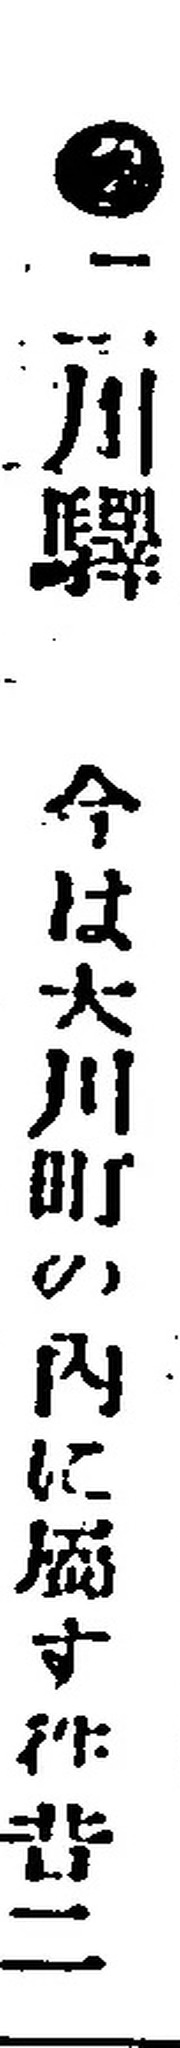●二川駅今は大川町の内に属す往昔二
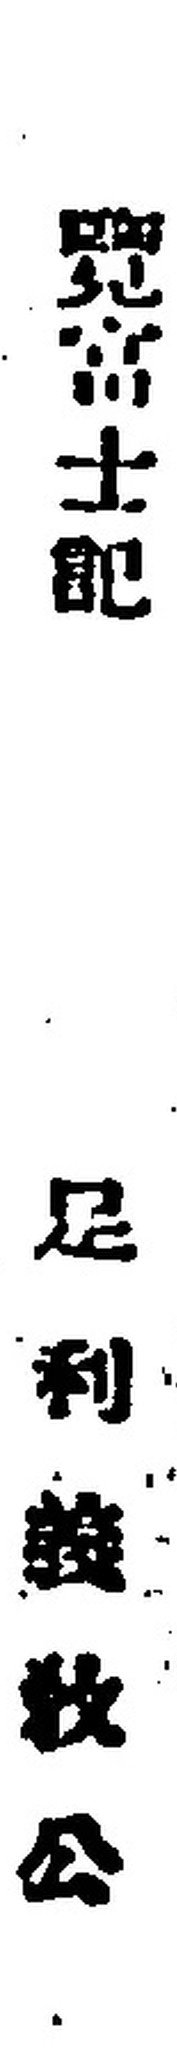覧富士記足利義教公
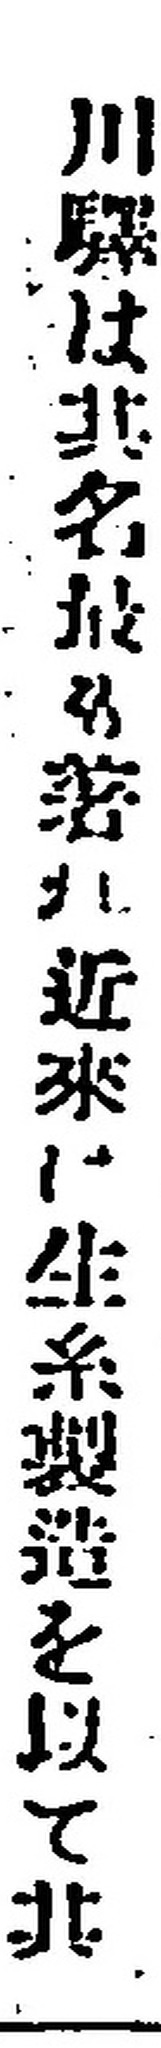川駅は其名最も著れ近来は生糸製造を以て其
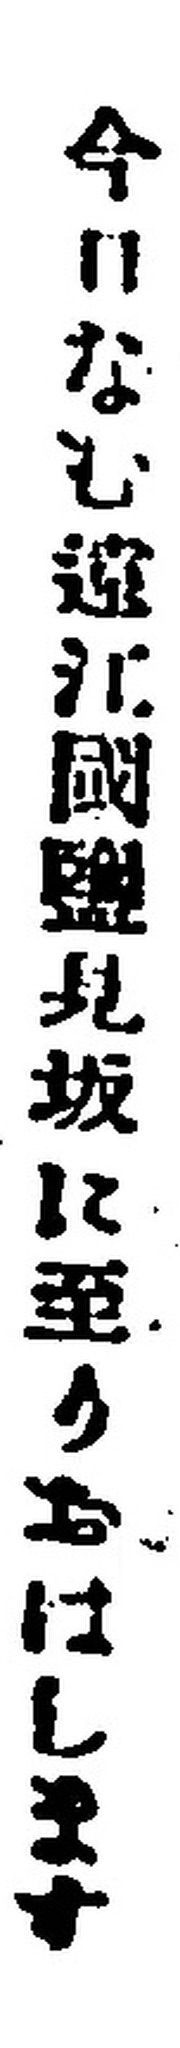今日なむ遠江国塩見坂に至りおはします
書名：東参名勝案内
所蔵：国立国会図書館 National Diet Library, JAPAN
